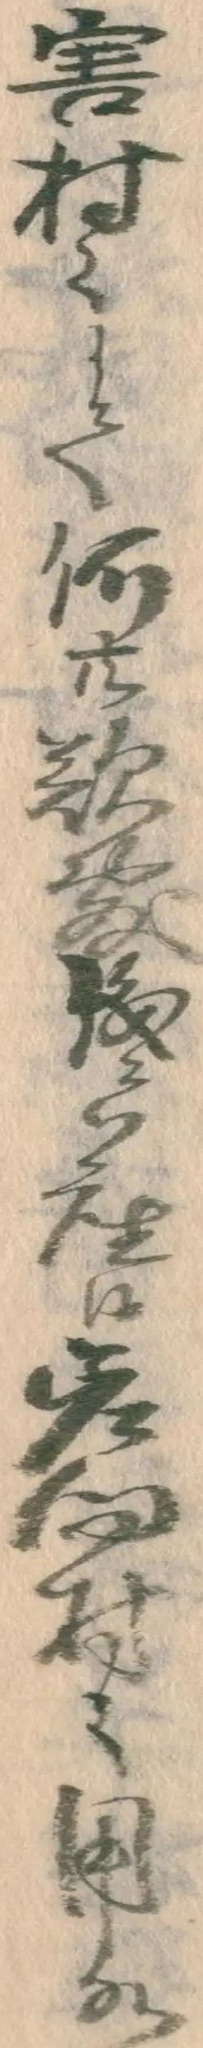害村々ニ而何共歎敷儀ニ御座候差向村々用水
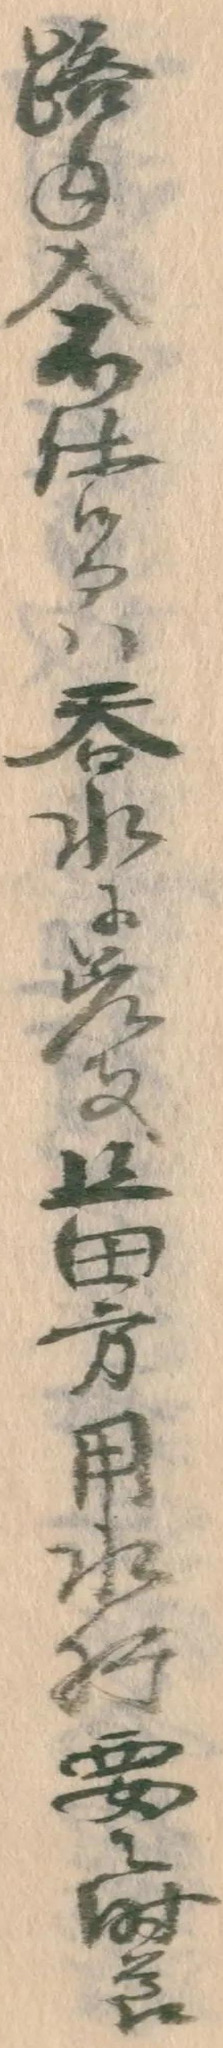路手入不仕候てハ呑水ニ差支且田畑用水肝要之時節
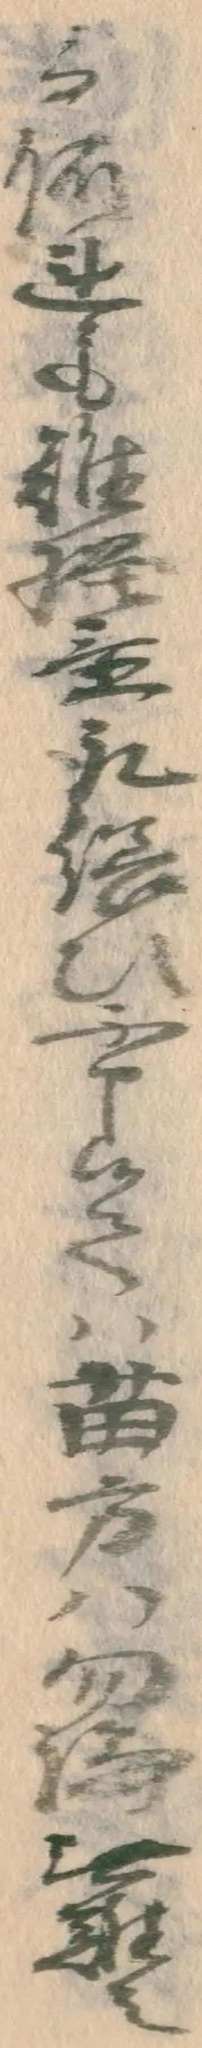ニ而何れも難捨置取繕ひ不申候てハ苗方ハ勿論無難之
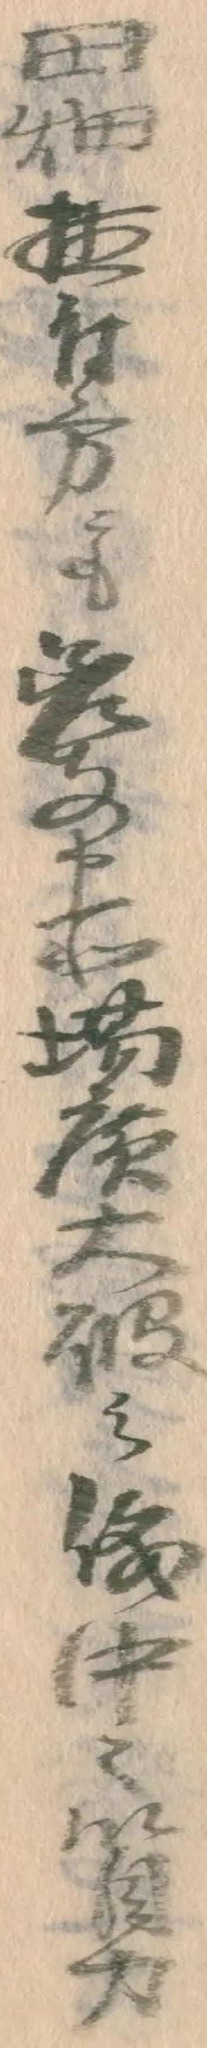田畑植付方ニも差支申処場広大破之儀中々以自力
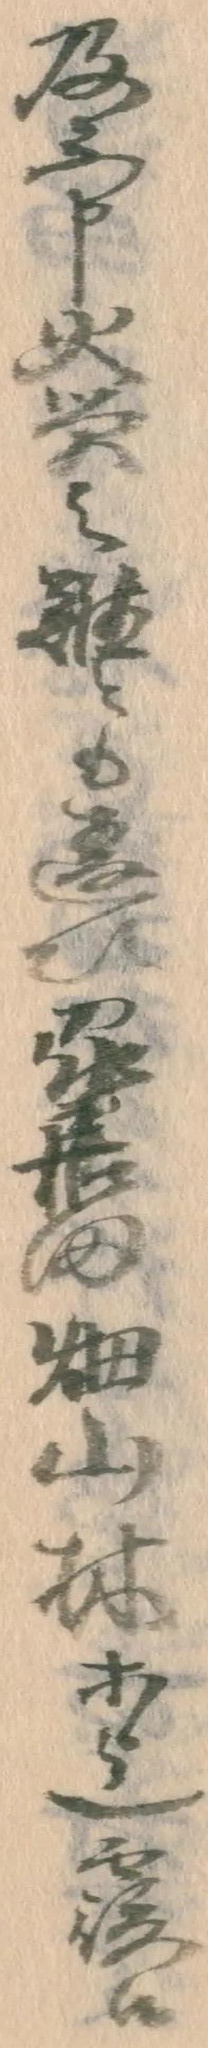及不申火災之難と違ひ家居田畑山林等迄覆候
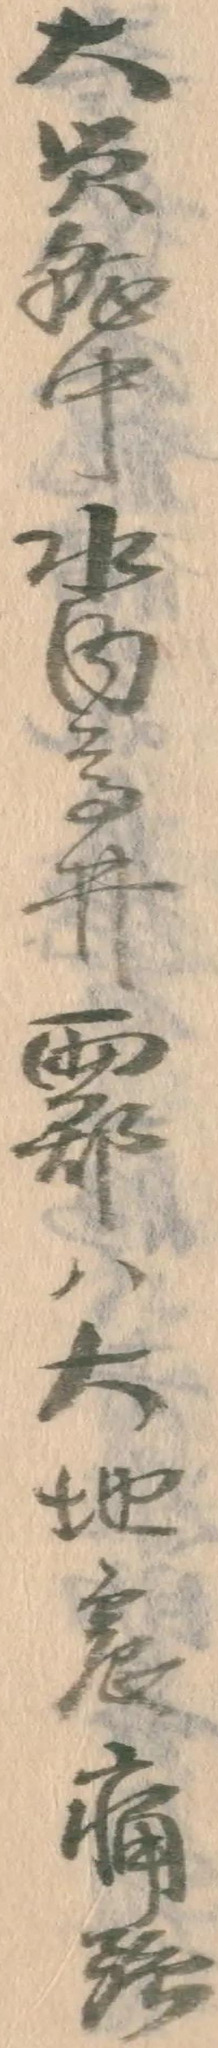大災就中水内高井両郡ハ大地震痛強
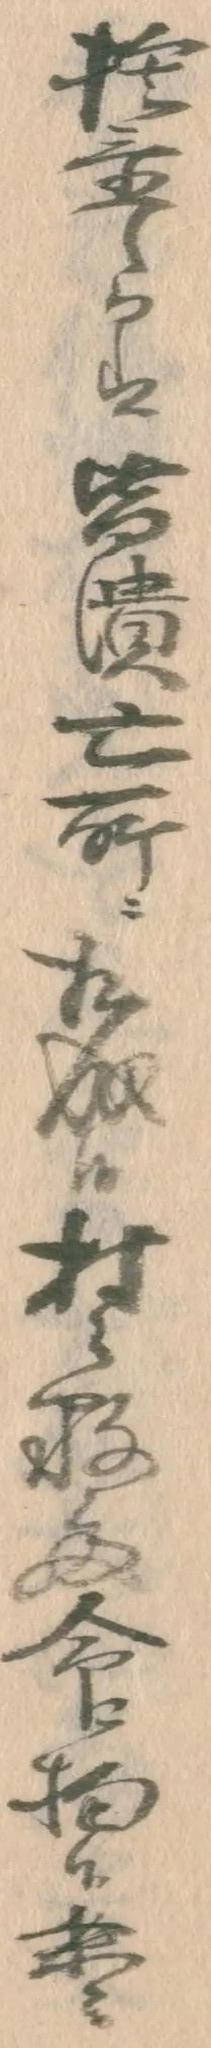捨置候而は皆潰亡所ニ相成候村々数多人命拘り末々
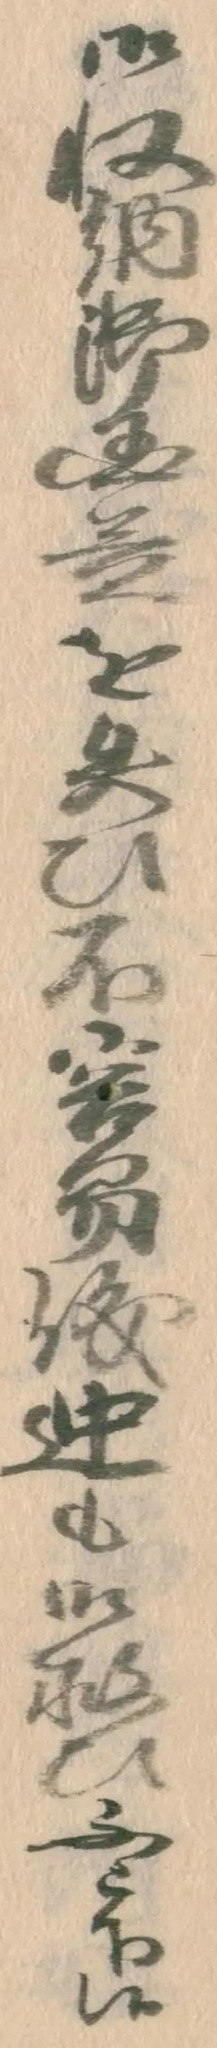御収納御国益ヲ失ひ不容易儀迚も御救ひ不被下候
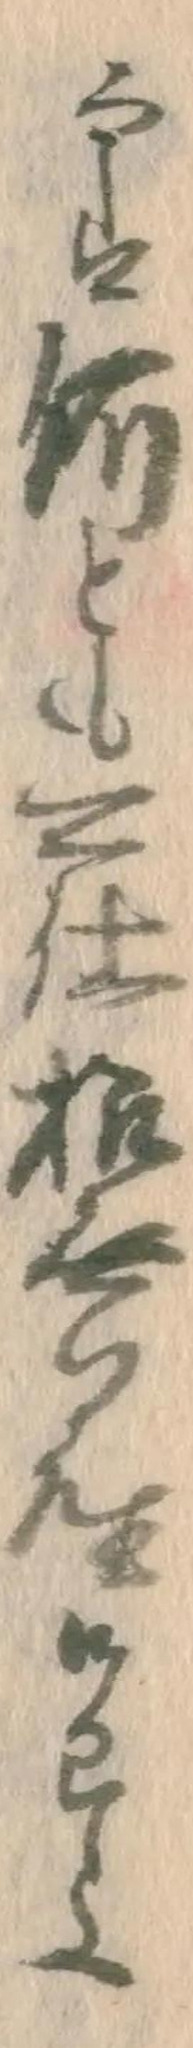而は何とも可仕様無御座候已上
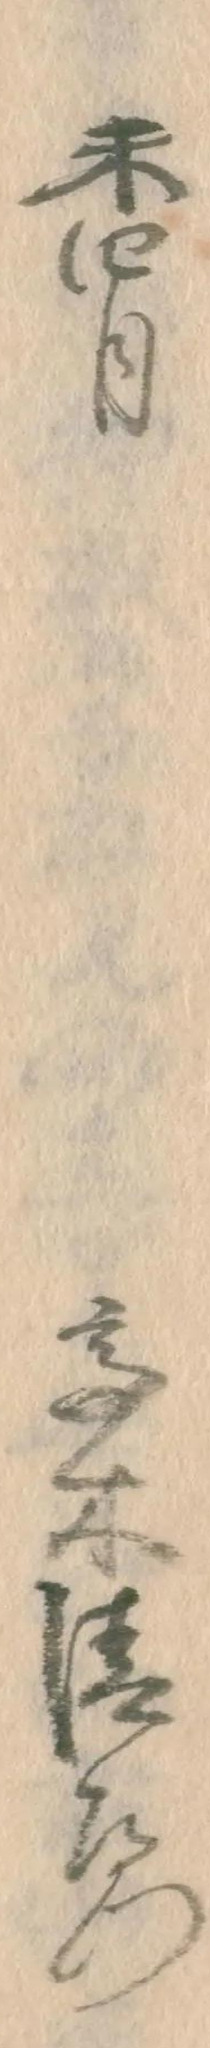未四月高木清左衛門

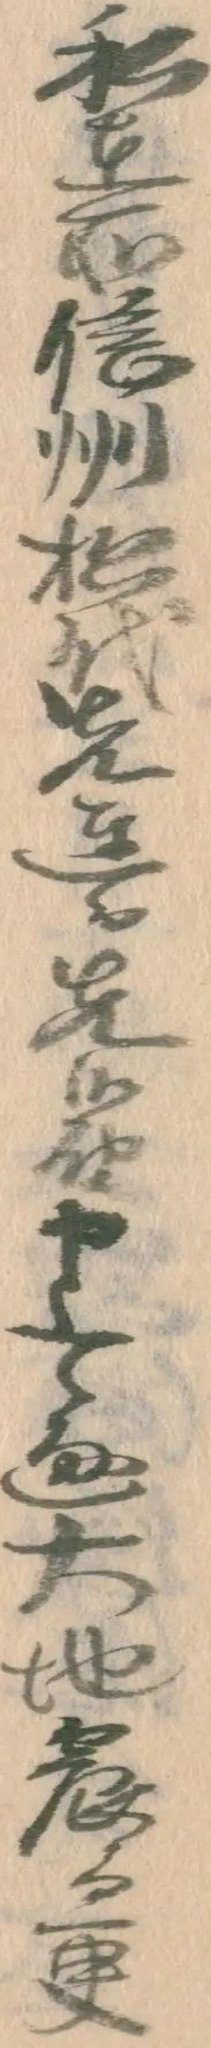私在所信州松代先達而先御届申上候通大地震ニ而更
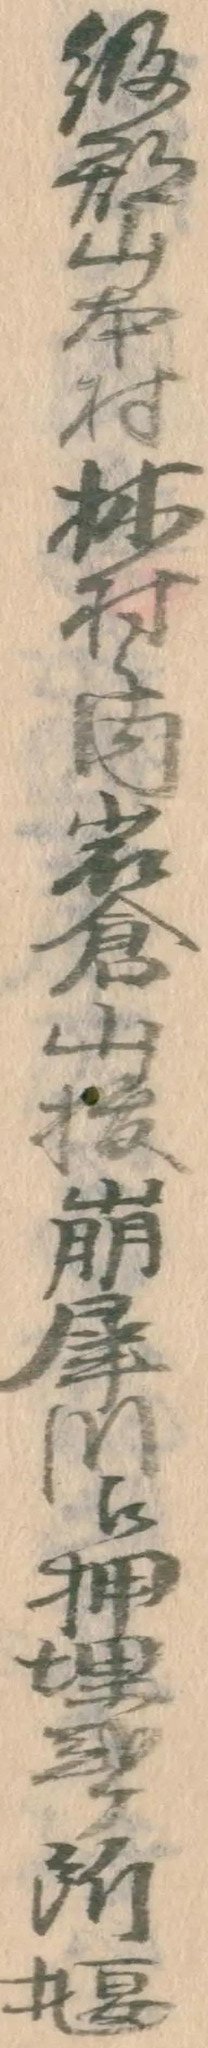級郡山平村林村之内岩倉山抜崩犀川江押埋弐ケ所堰
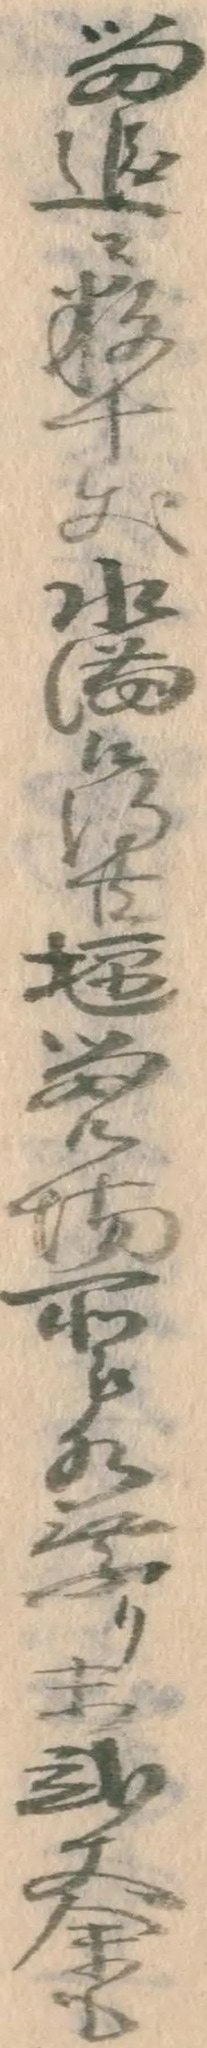留追々数十丈水溜候得共堰留候場所江水乗未弐丈余も
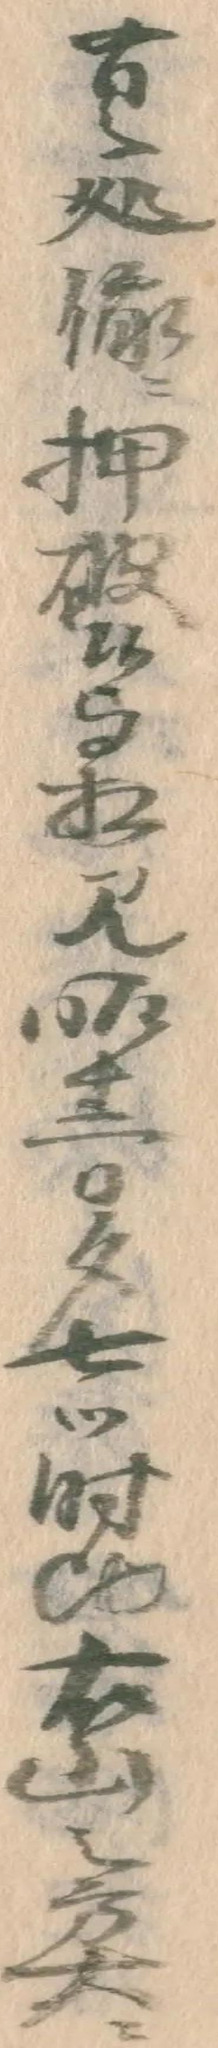有候処俄ニ押破候と相見昨十三日夕七ツ時比右山之方大ニ
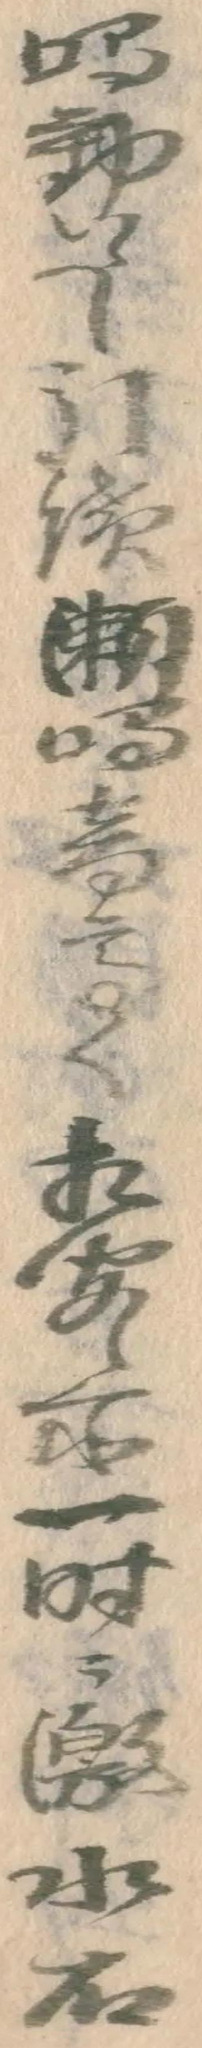鳴動いたし引続瀬鳴之音高く相聞候所一時二激水右
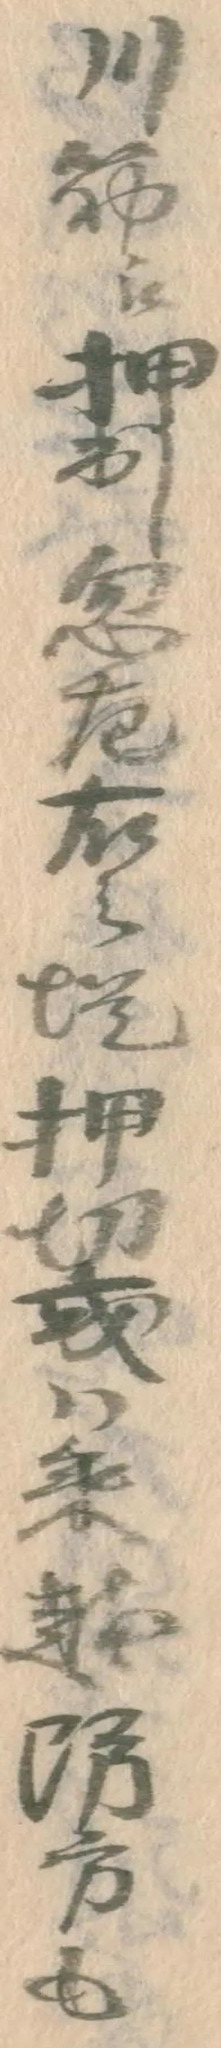川筋江押出し忽左右之堤押切或ハ乗越防方も
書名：信州大地震之記
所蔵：国立国会図書館 National Diet Library, JAPAN
